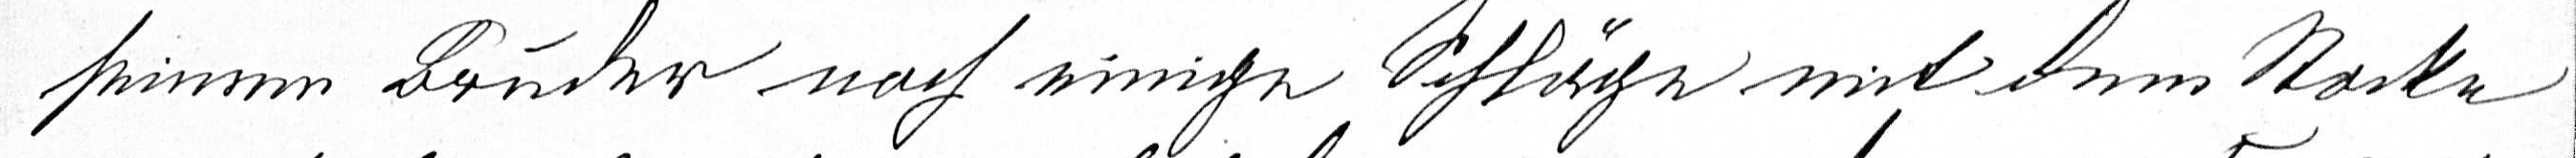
seinem Bruder nach einige Schläge mit dem Stocke
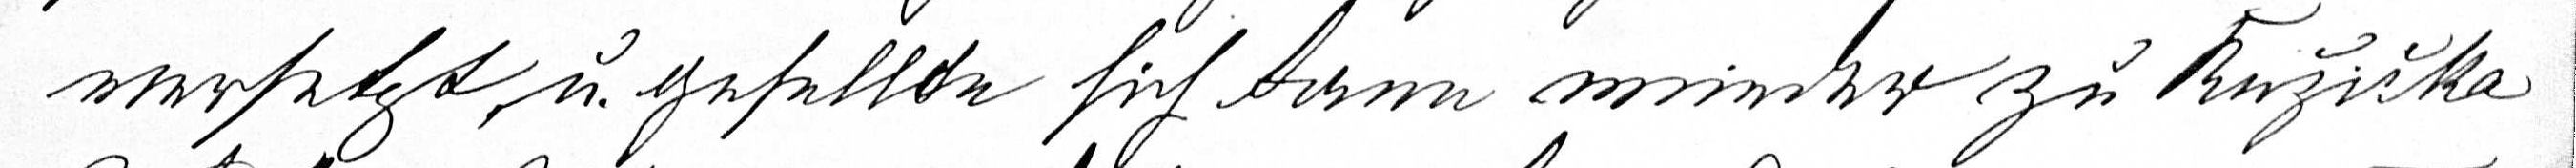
versetzt u. gesellte sich dann wieder zu Bužička
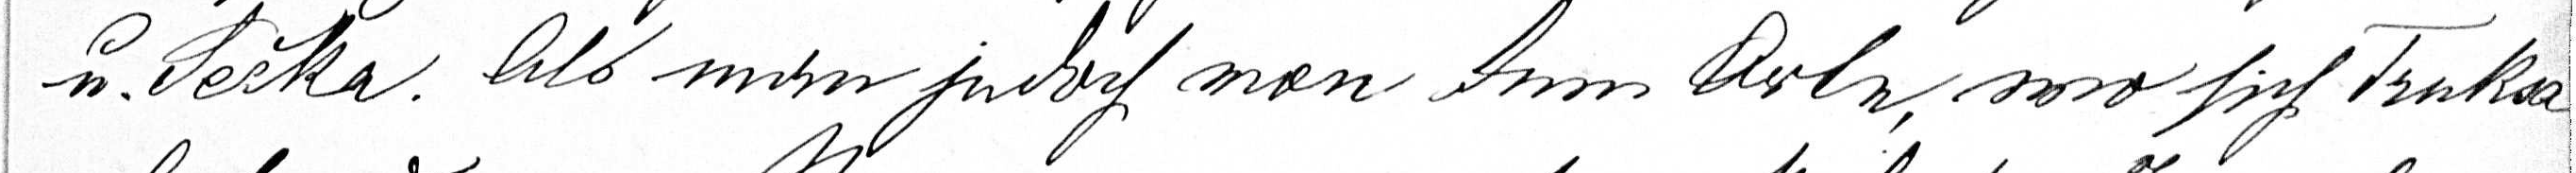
u. Sečka. Als man jedoch von dem Orte, wo sich Truksa
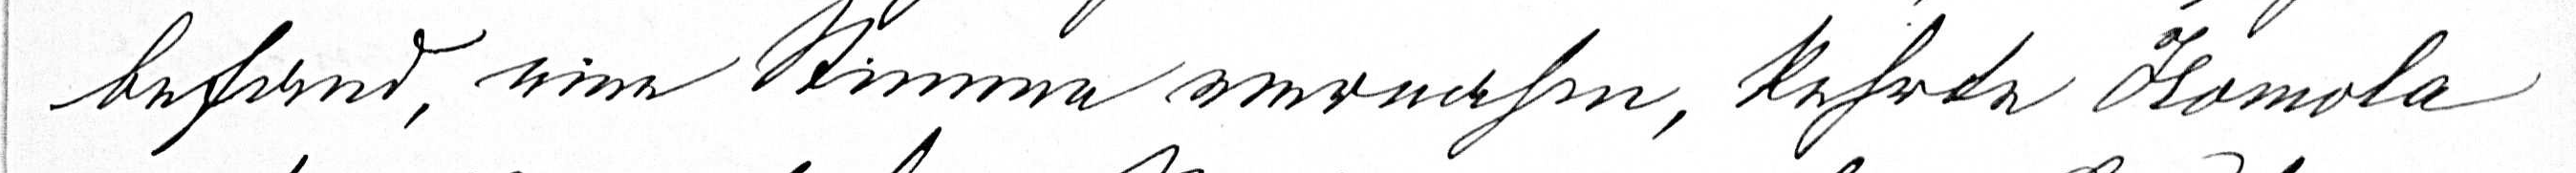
befand, eine Stimme vernahm, kehrte Homola
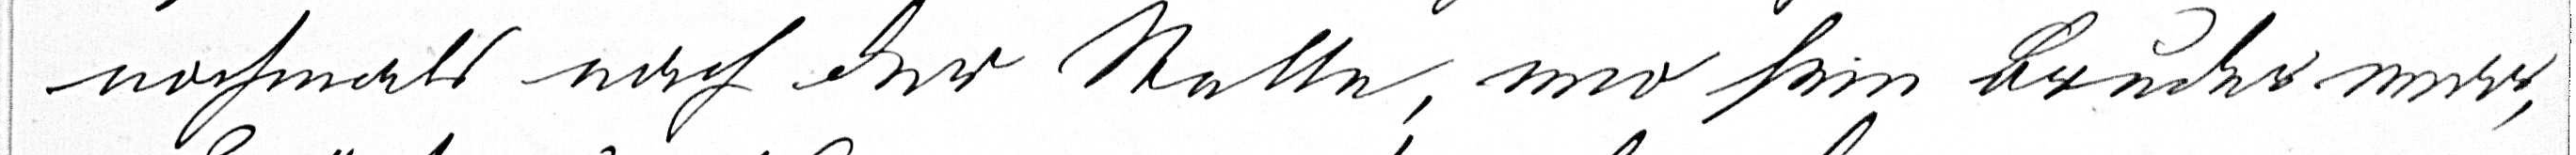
nochmals nach der Stette, wo sein Bruder war
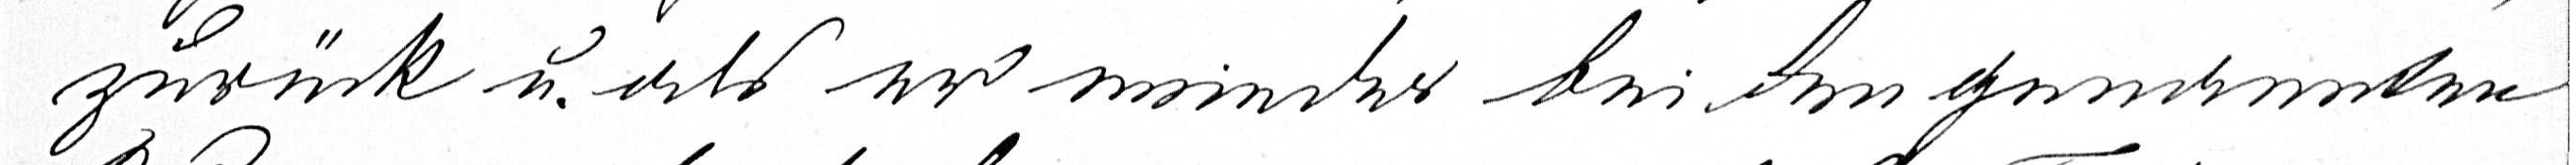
zurück u. als er wieder bei den genannten
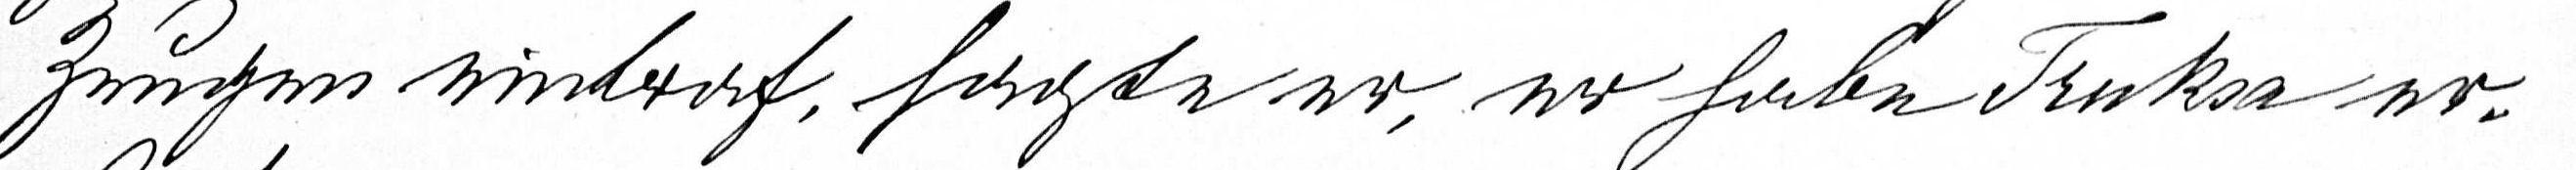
Zeugen eintraf, sagte er, er habe Truksa er¬
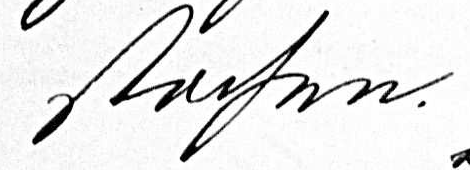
stochen.
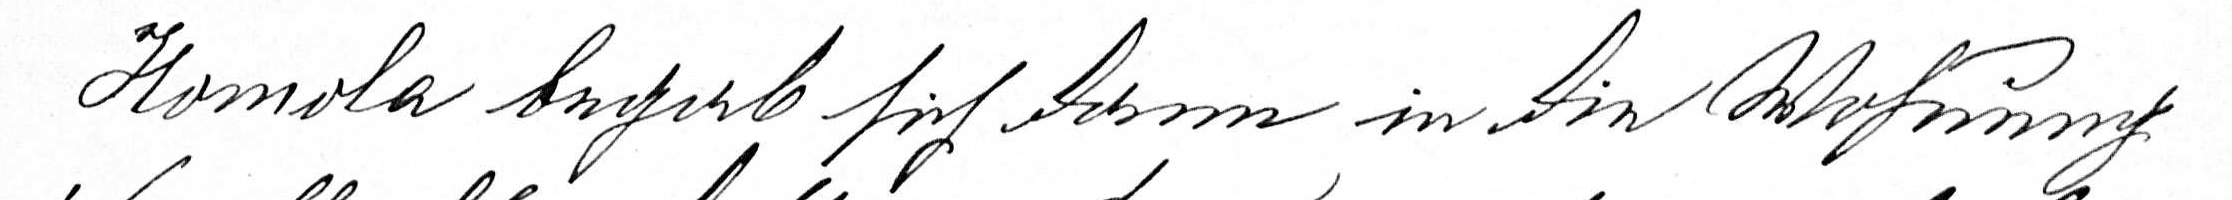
Homola begab sich dann in die Wohnung
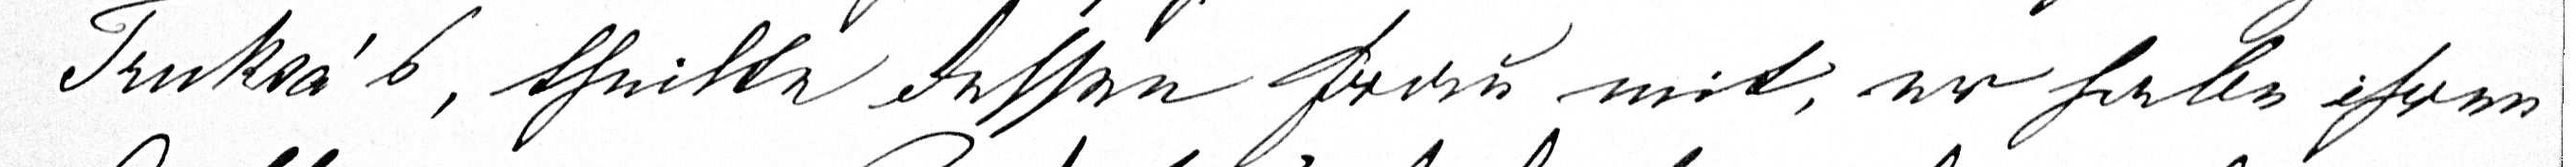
Truksa’s, tehilte dessen Frau mit, er habe ihren
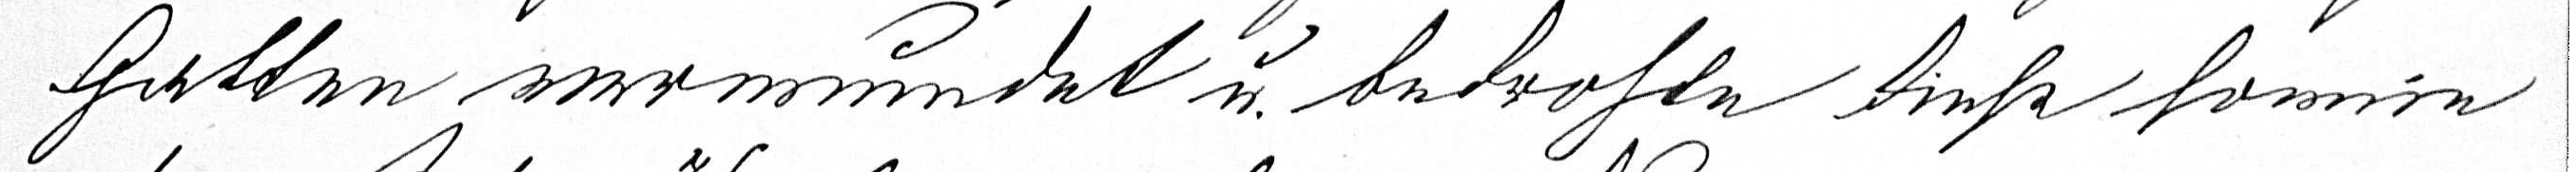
Gatten verwundet u bedrohte diese sowie
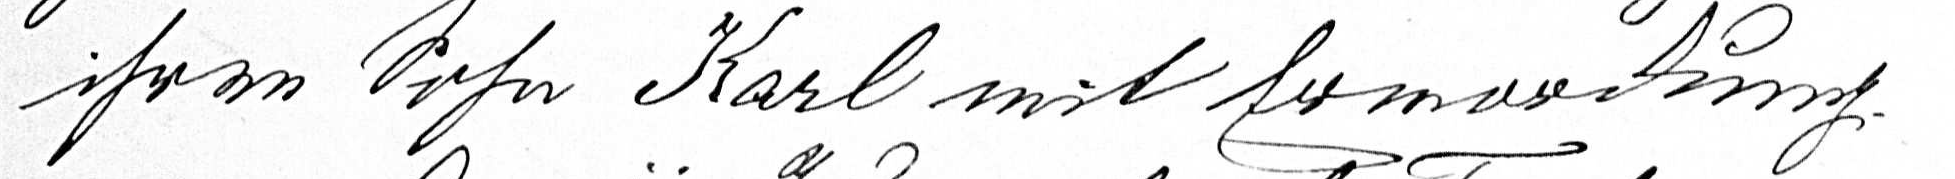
ihren Sohn Karl mit Ermordung.
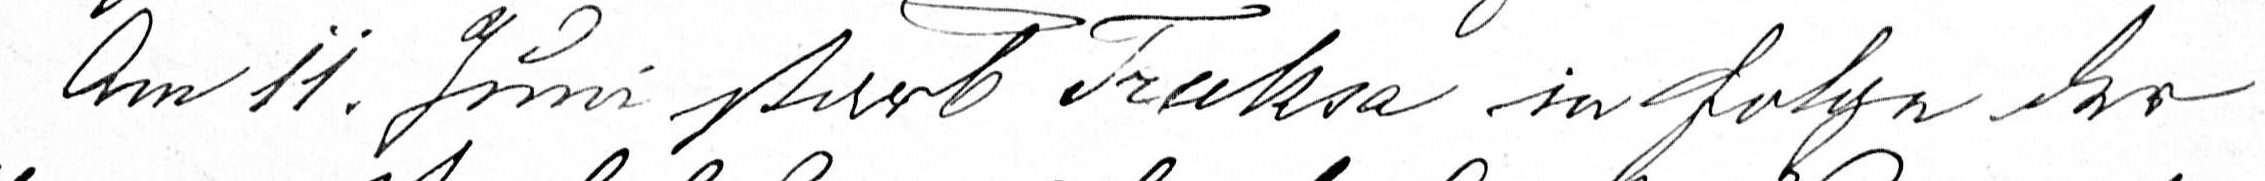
Am 11. Juni starb Truksa in Folge der
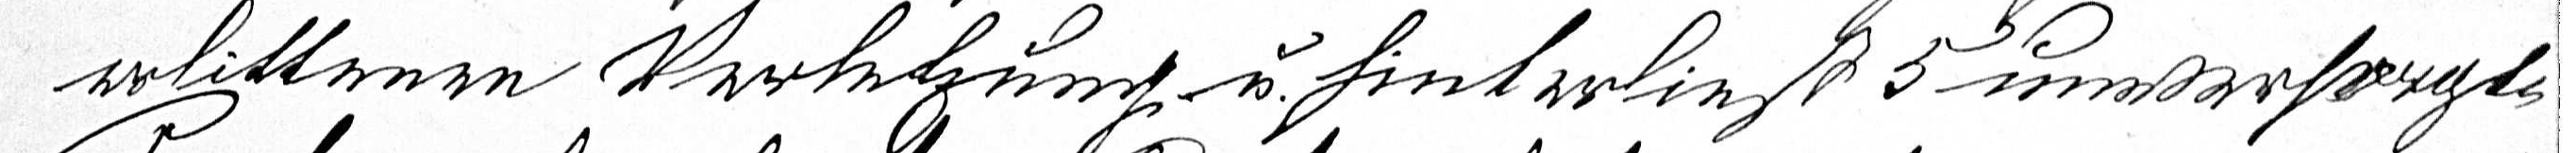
erlittenen Verletzung u. hinterließ 5 unversorgte
